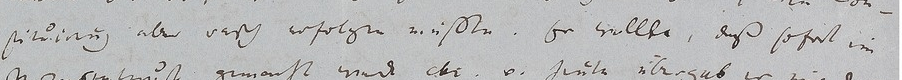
stituirung aber rasch erfolgen müßte. Er wollte, daß sofort ein
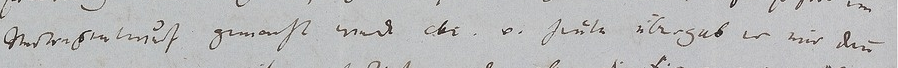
Vertragsentwurf gemacht werde etc. &. heute übergab er mir dann
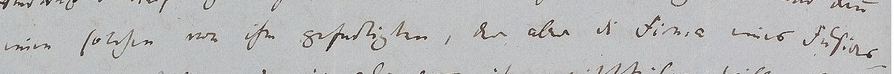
einen solchen von ihm gefertigten, der aber die Firma eines Fusions-
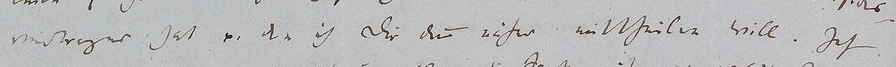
vertrages hat &. den ich Dir dann näher mittheilen will. Ich
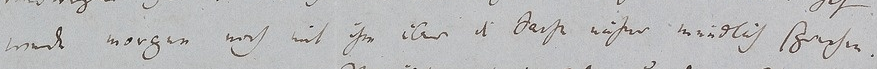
werde morgen noch mit ihm über die Sache näher mündlich sprechen.
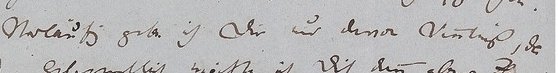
Vorläufig gebe ich Dir nur davon Kenntniß, da
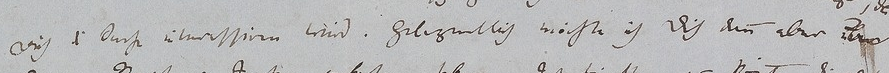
Dich die Sache interessiren wird. Gelegentlich möchte ich Dich dann aber um
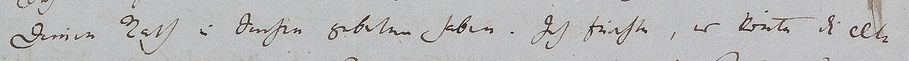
Deinen Rath in Sachen gebeten haben. Ich fürchte, es könnte die alte
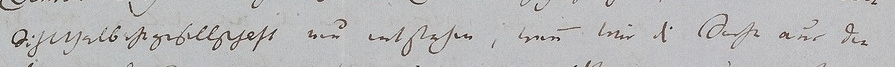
Sihlthalbahngesellschaft neu entstehen, wenn wir die Sache aus den
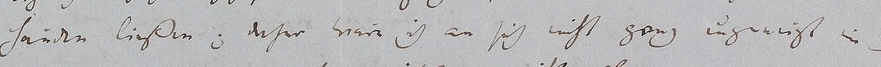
Händen ließen; daher wäre ich an sich nicht ganz ungeneigt ein-
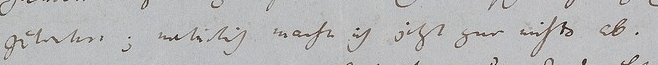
zutreten; natürlich mache ich jetzt gar nichts ab.
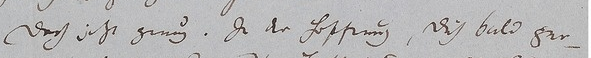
Doch jetzt genug. In der Hoffnung, Dich bald per-
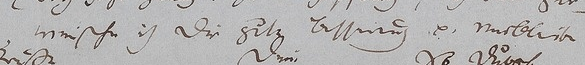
wünsche ich Dir gute Besserung &. verbleibe
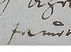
Dein
